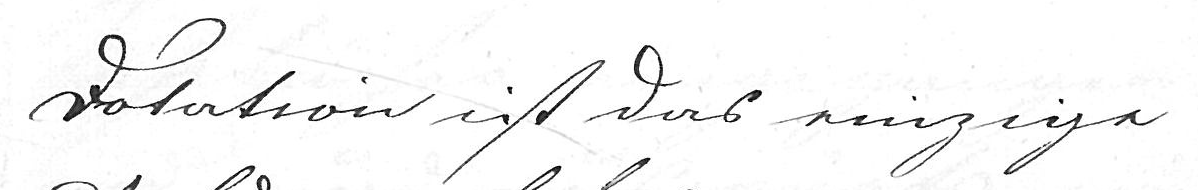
Dotation ist das einzige
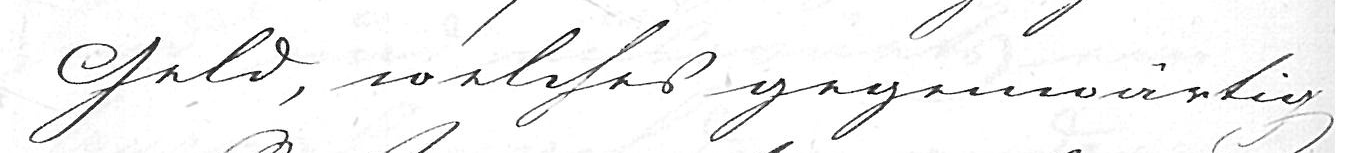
Geld, welches gegenwärtig
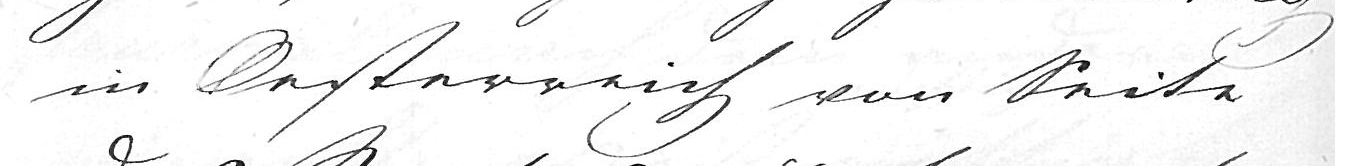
in Oesterreich von Seite
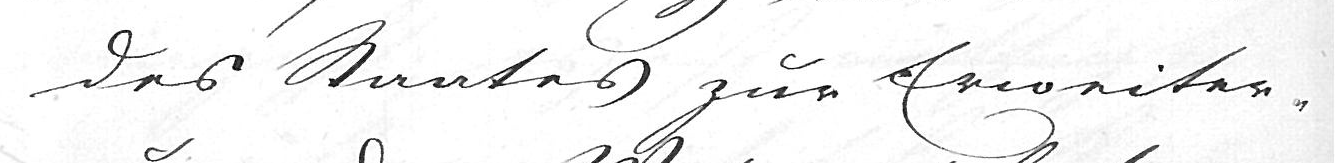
des Staates zur Erweiter-
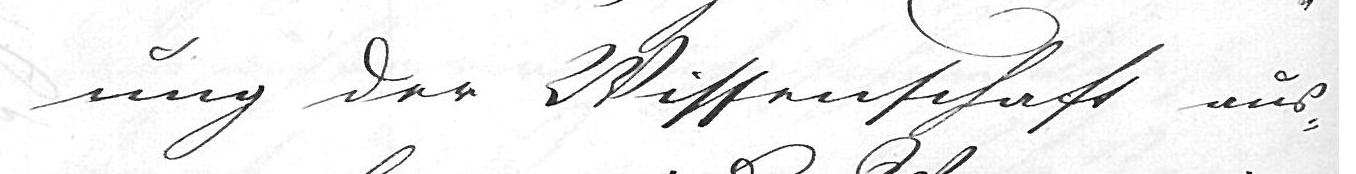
ung der Wissenschaft aus-
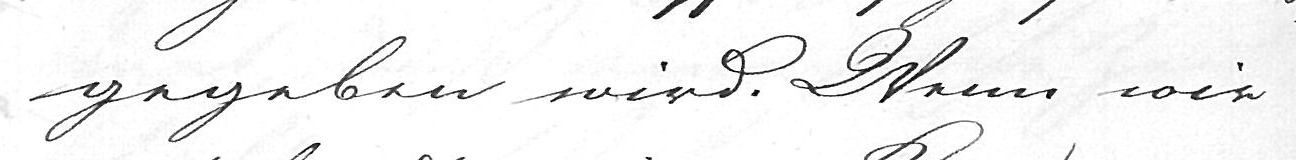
gegeben wird. Wenn wir
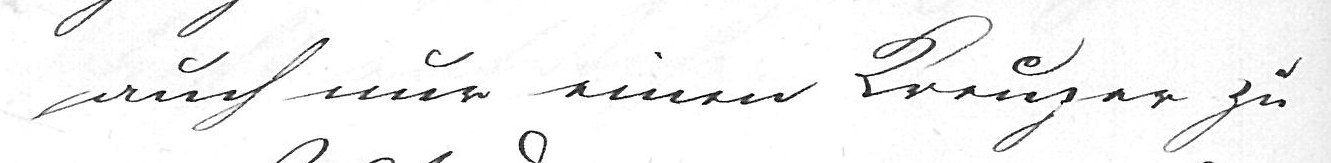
auch nur einen Kreuzer zu
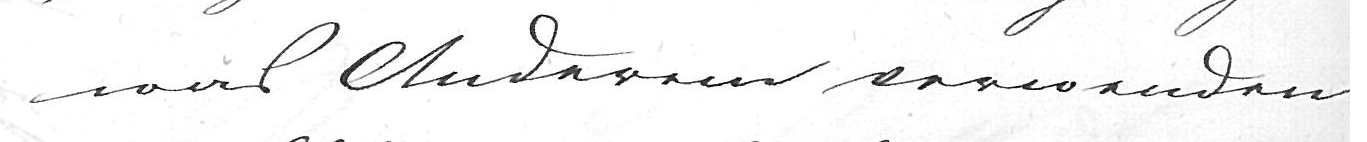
was Anderm verwenden
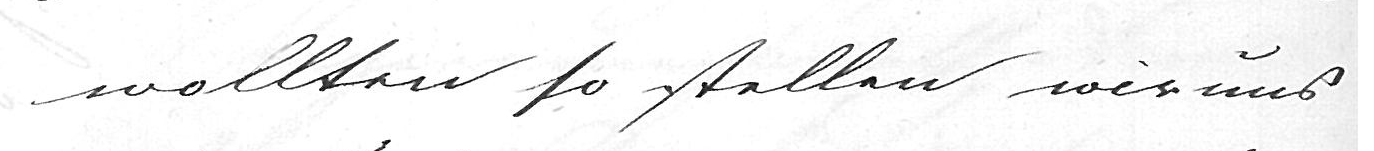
wollten, so stellen wir uns
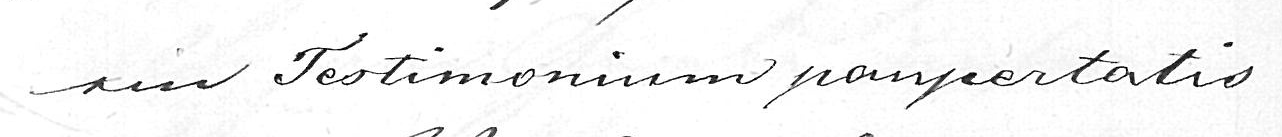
ein Testimonium pauperitatis
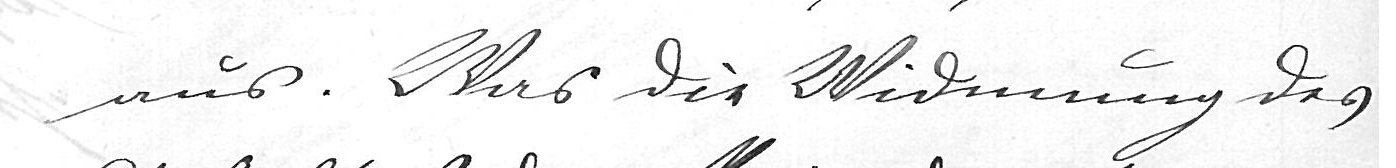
aus. Was die Widmung des
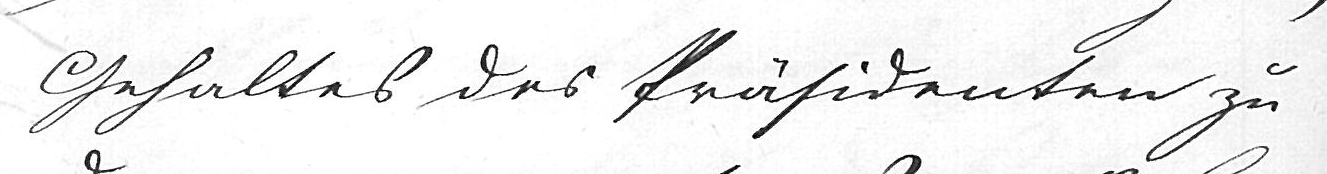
Gehaltes des Präsidenten zu
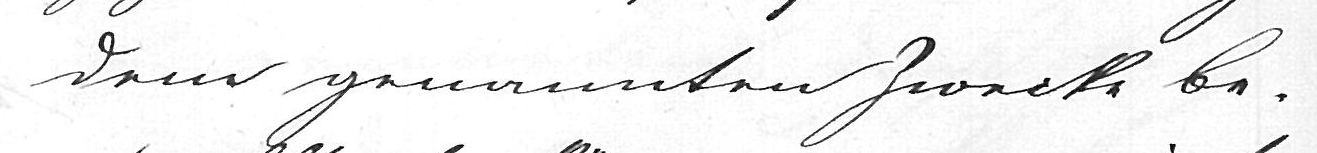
dem genannten Zwecke be-
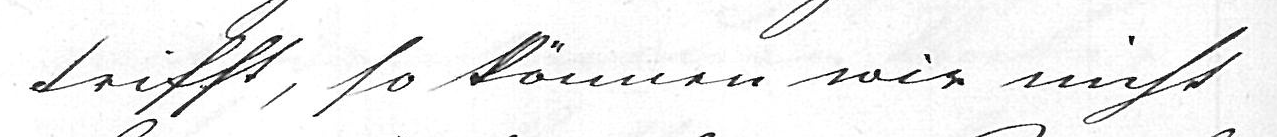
trifft, so können wir nicht
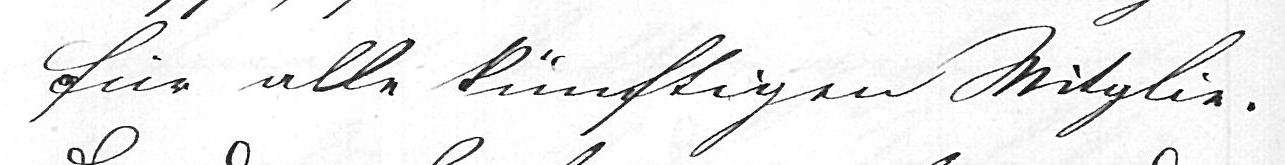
für alle künftigen Mitglie-
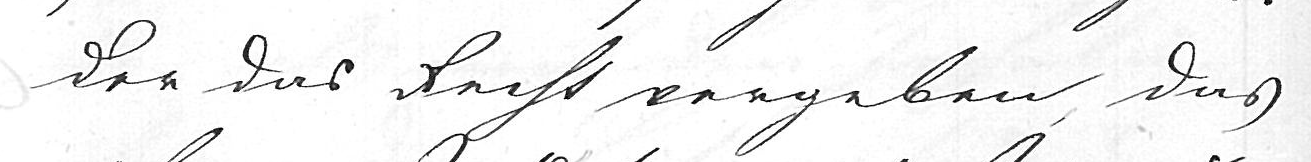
der das Recht vergeben, das
